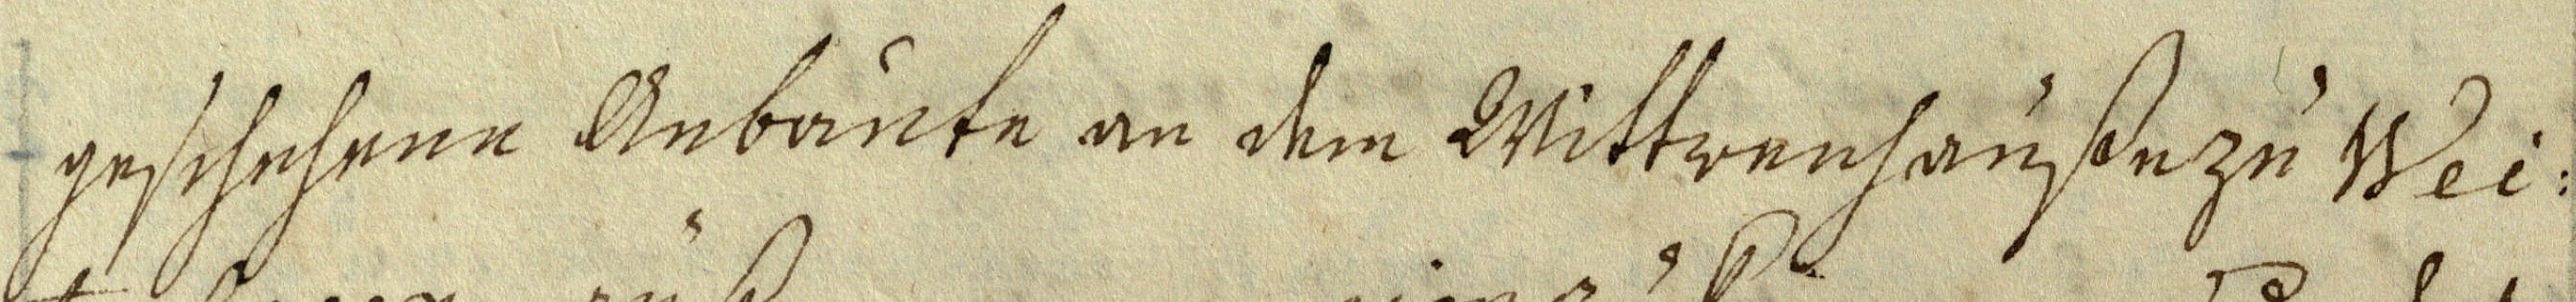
geschehene Anbaute an dem Wittwenhauße zu Wei¬
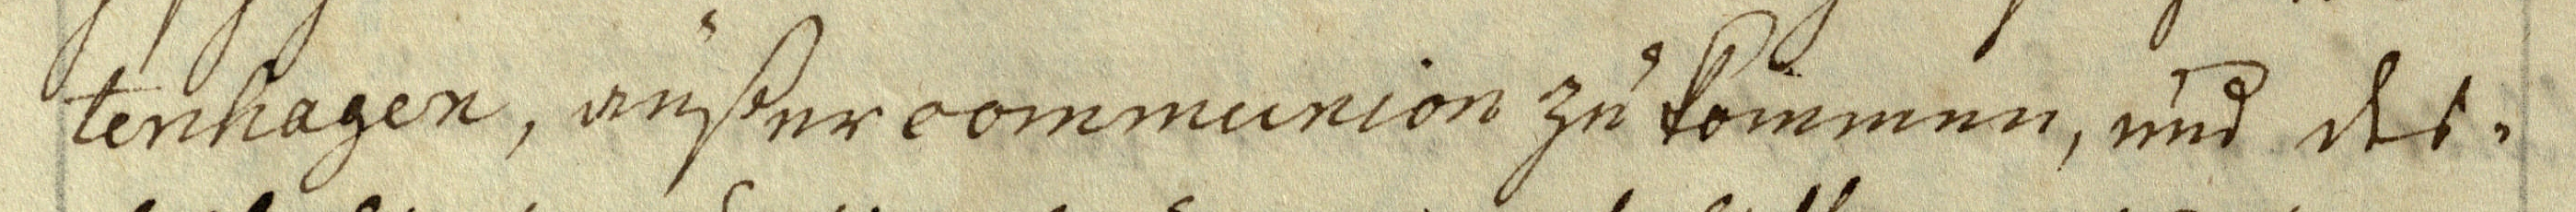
tenhagen, außer communion zu kommen, und des¬
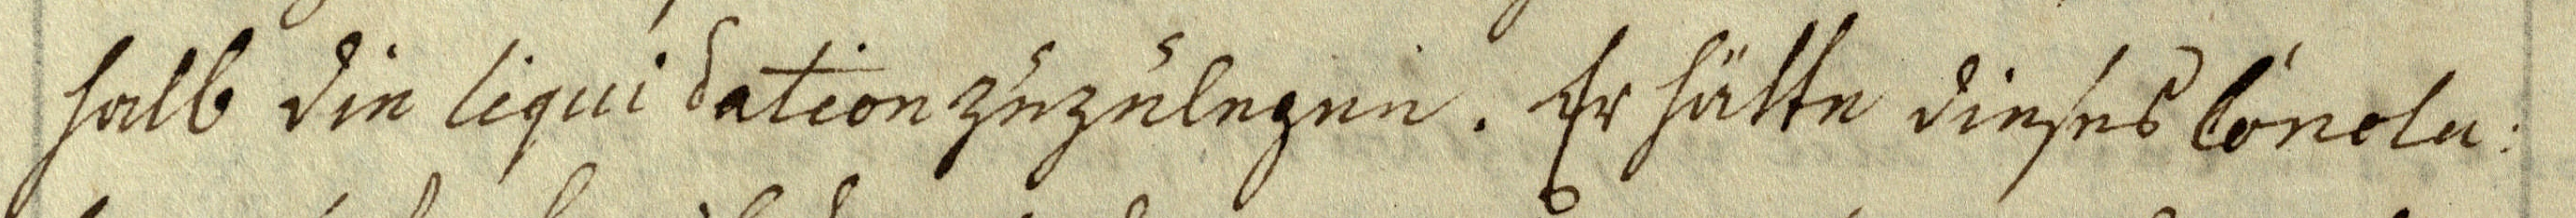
halb die liquidation zuzulegen. Er hätte dieses Conclu¬
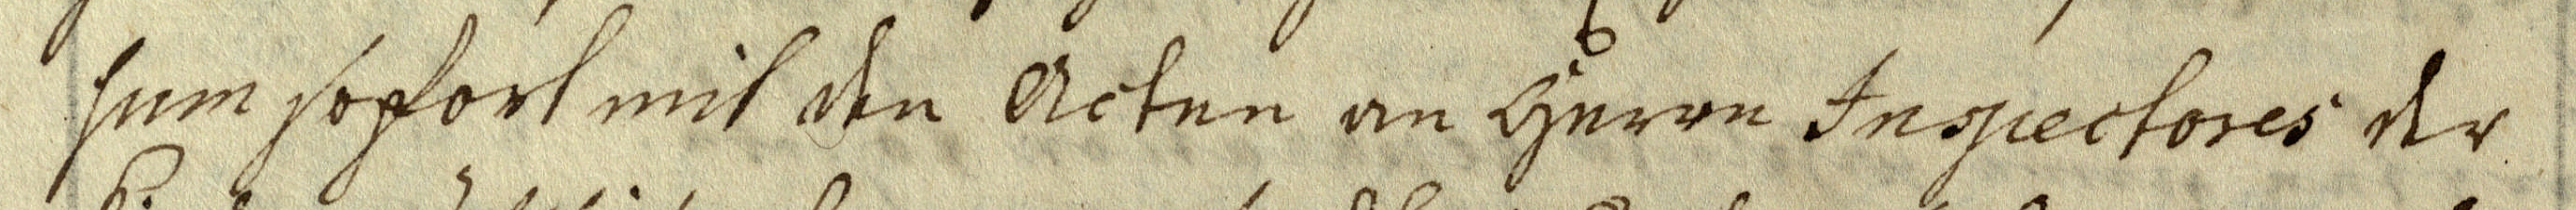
sum sofort mit den Acten an Herrn Inspectores der
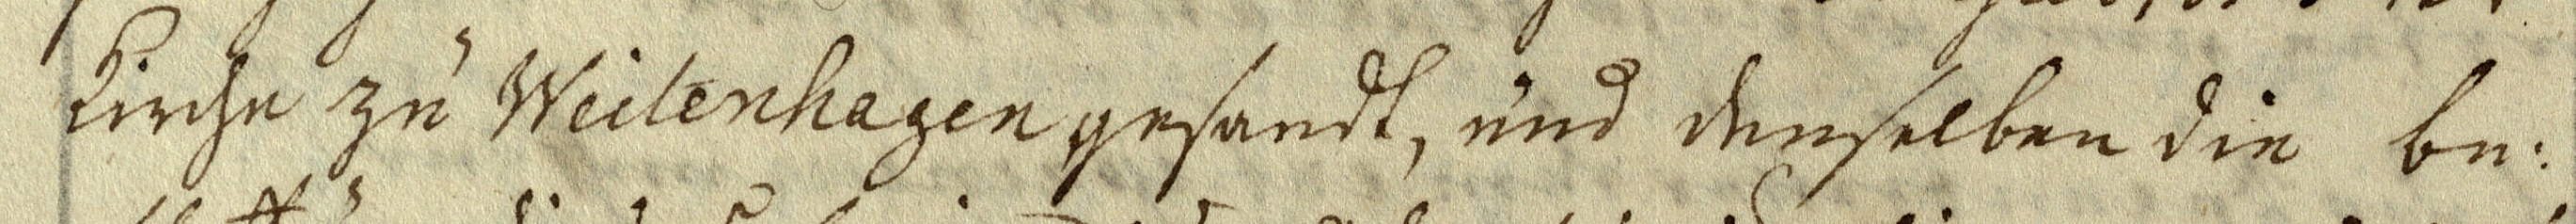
Kirche zu Weitenhagen gesandt, und denselben die Be¬
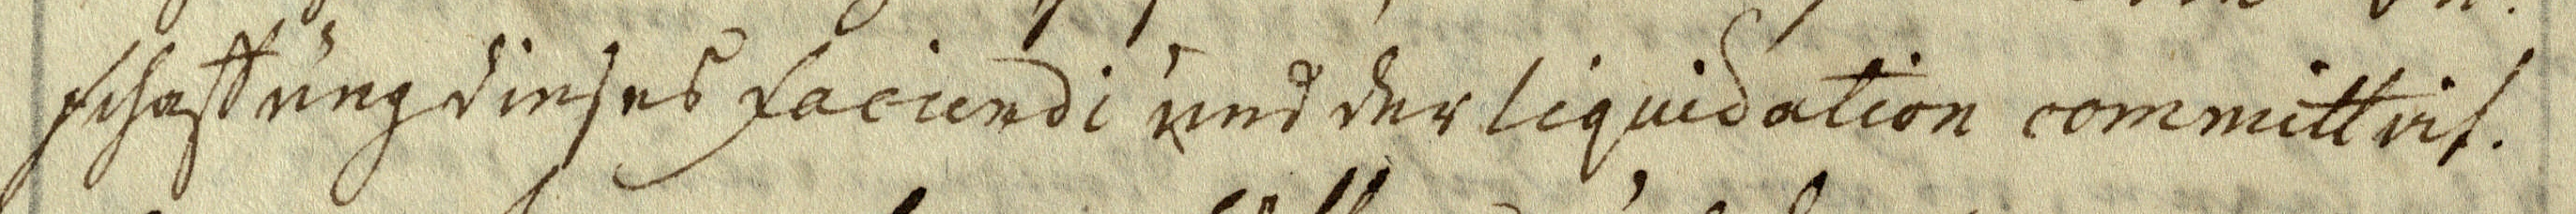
schaffung dieses faciendi und der liquidation committirt.
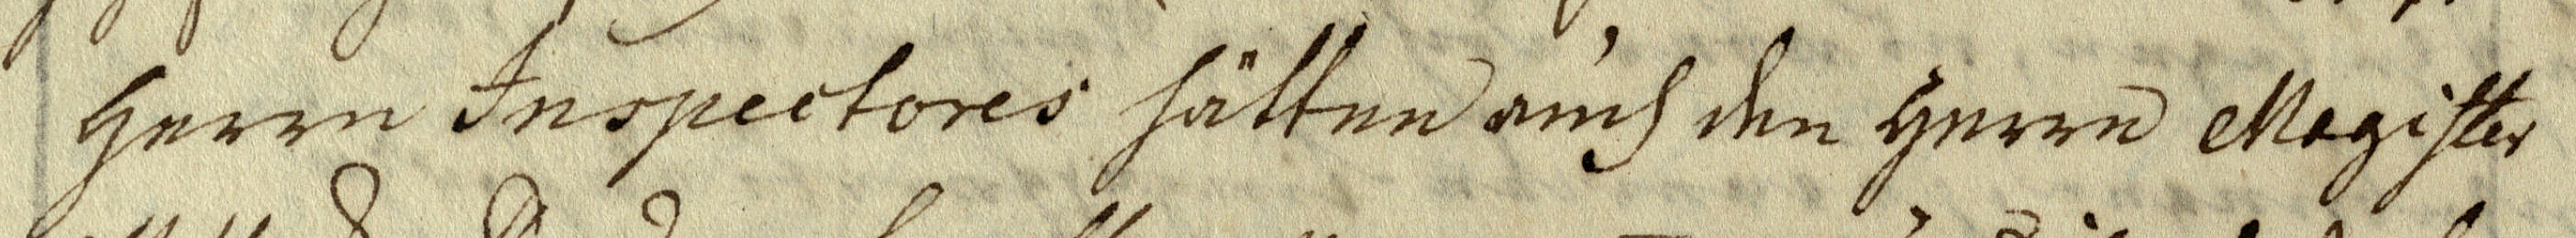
Herrn Inspectores hätten auch den Herrn Magister
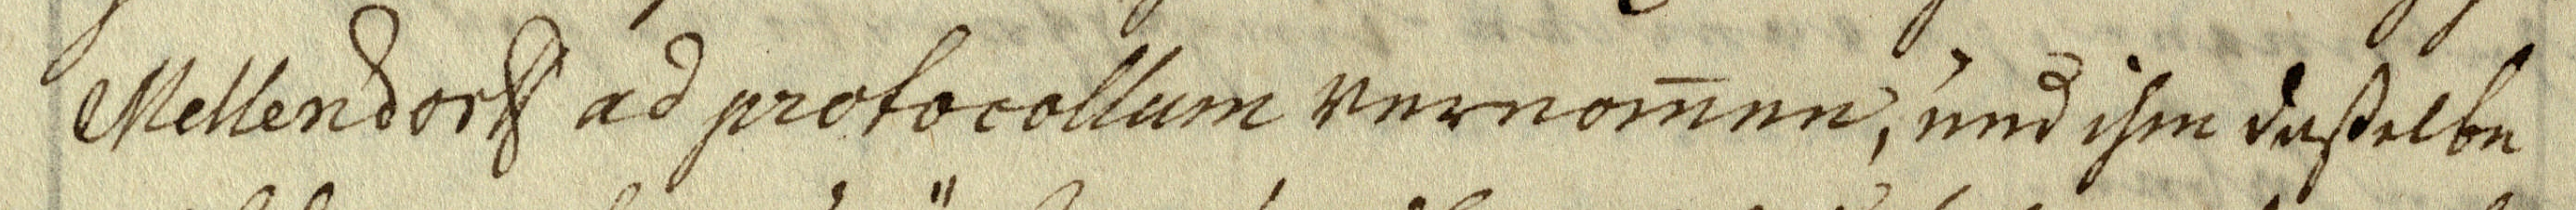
Mellendorff ad protocollum vernomen, und ihm daßelbe
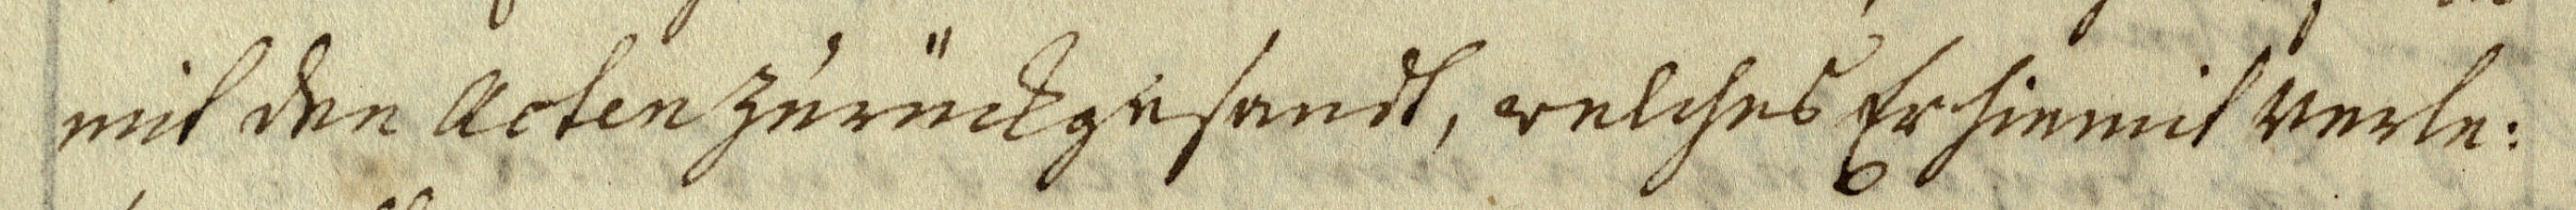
mit den Acten zurückgesandt, welches Er hiemit verle¬
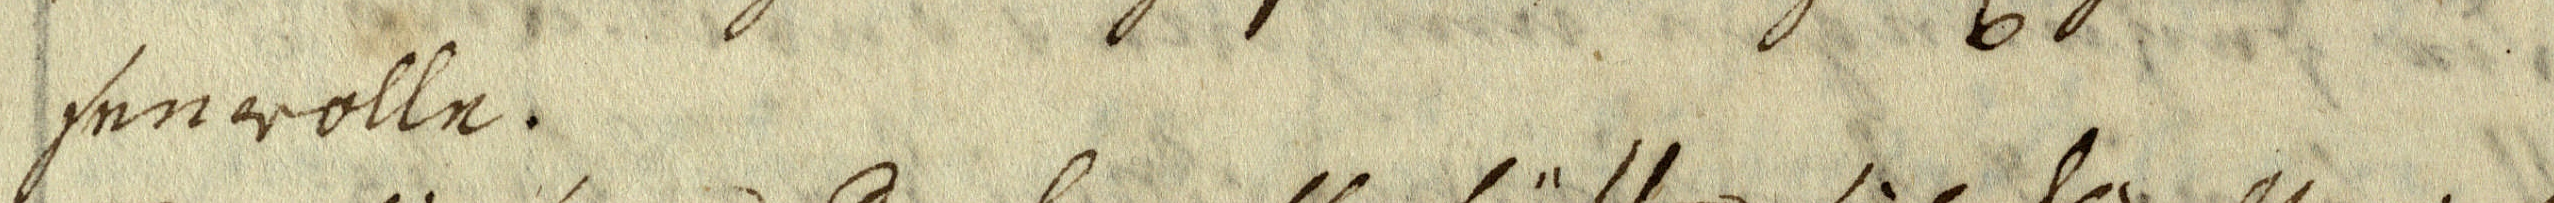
sen wolle.
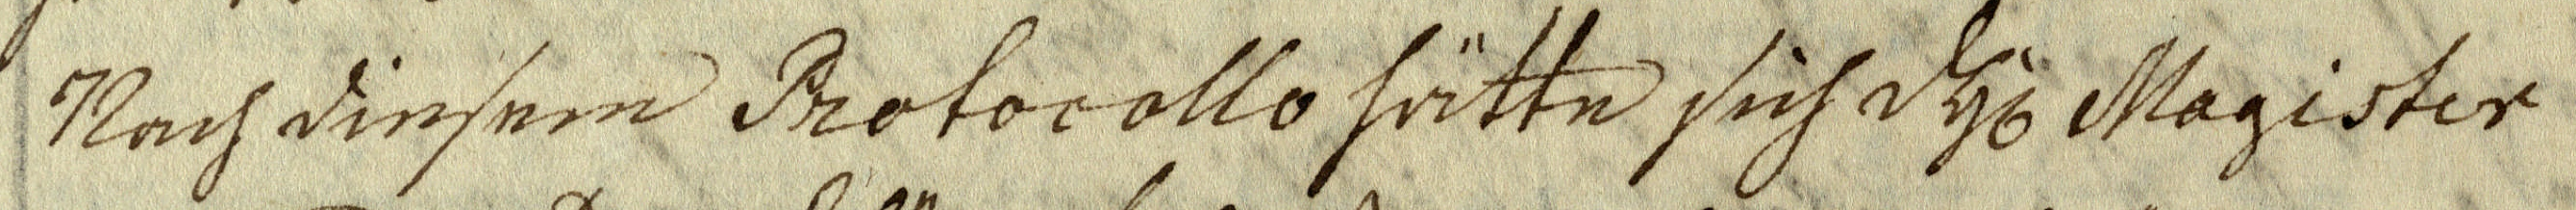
Nach diesem Protocollo hätte sich dh Magister
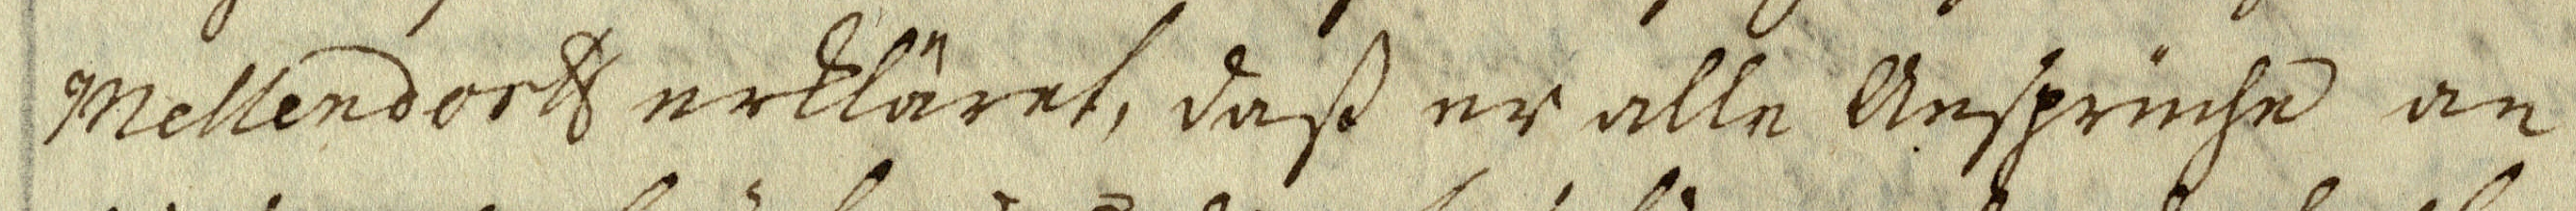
Mellendorff erkläret, daß er alle Ansprüche an
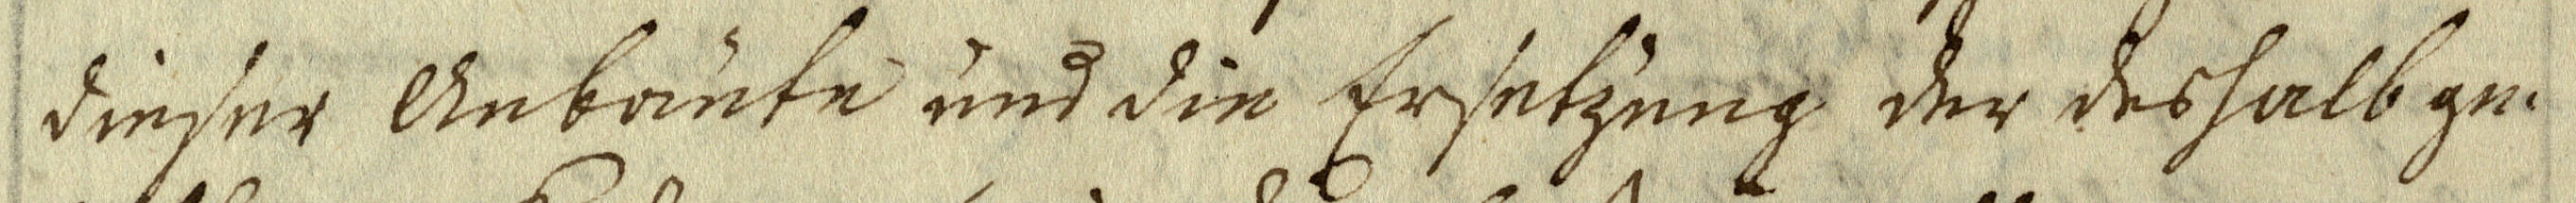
dieser Anbaute und die Ersetzung der deshalb ge¬
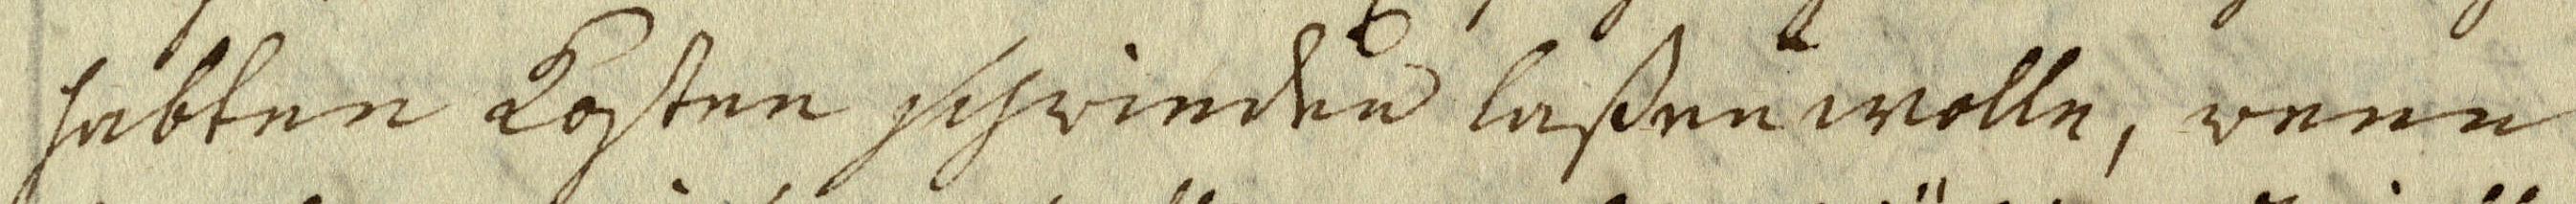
habten Kosten schwinden laßen wolle, wenn
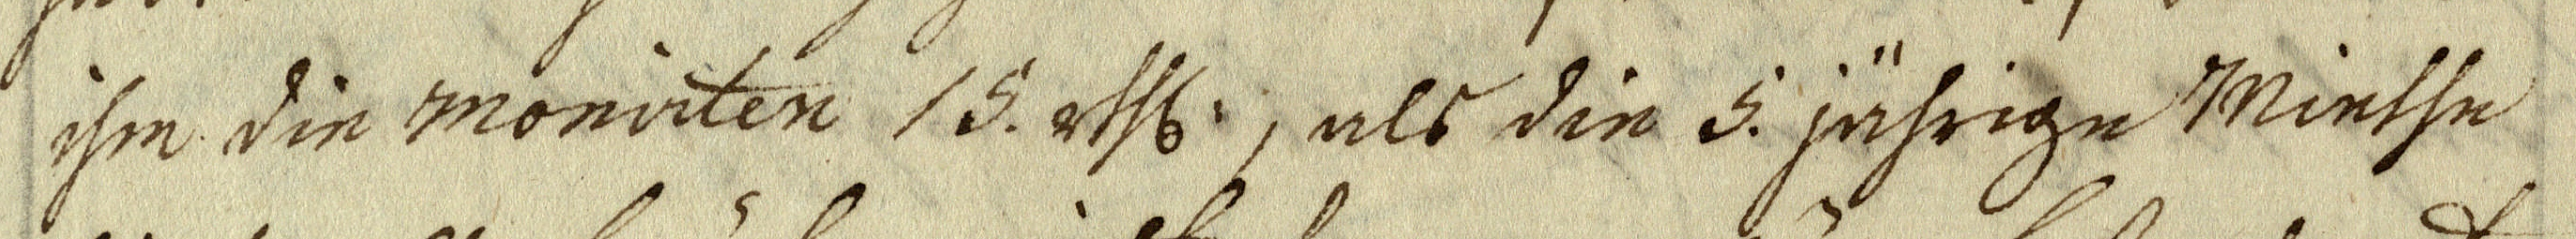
ihm die monirten 15 rl., als die 5 jährige Miethe
